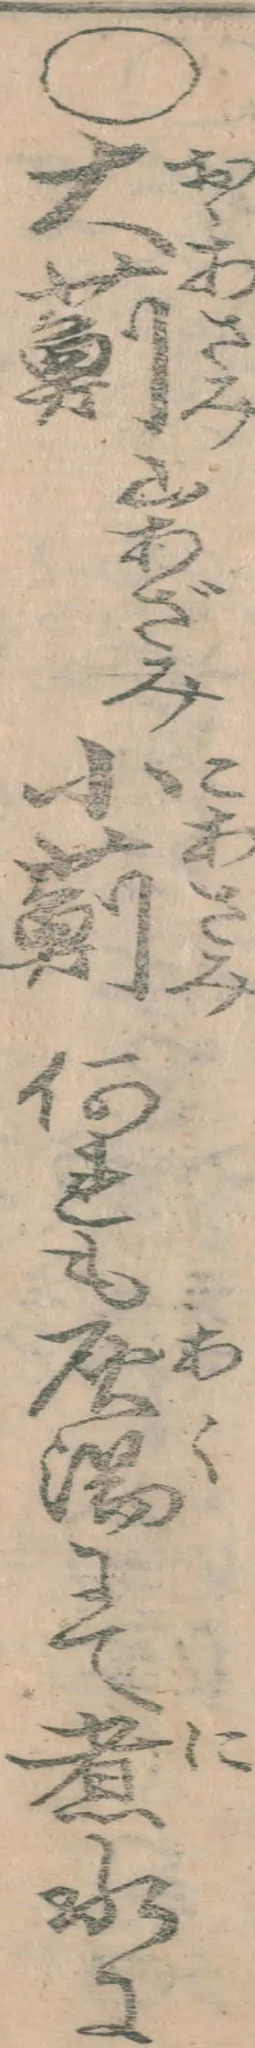〇大薊山あざみ小薊何れも灰湯にて煮水に
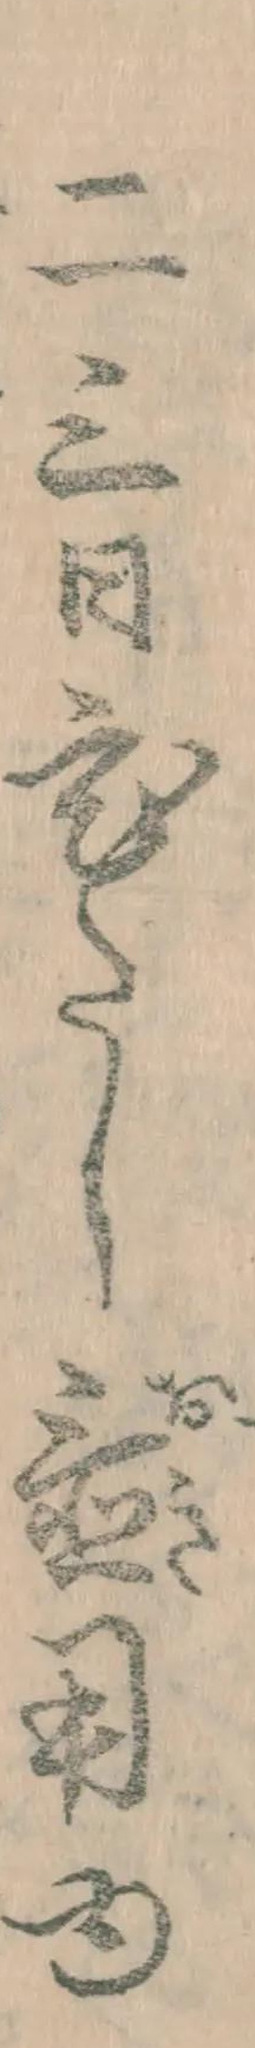二三日ひたし置湯用ゆ
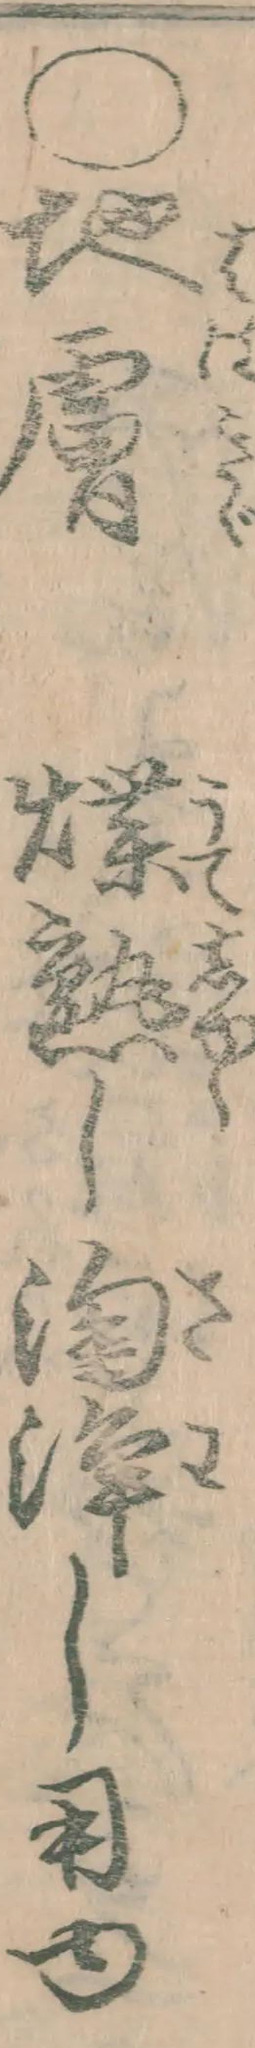〇地膚爛熟し淘浄し用ゆ
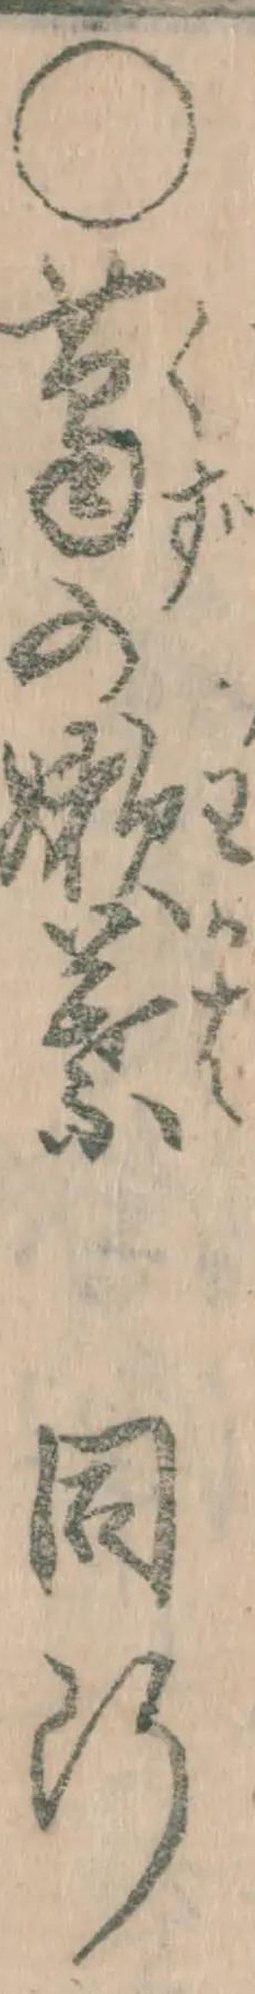〇葛の嫩葉同断
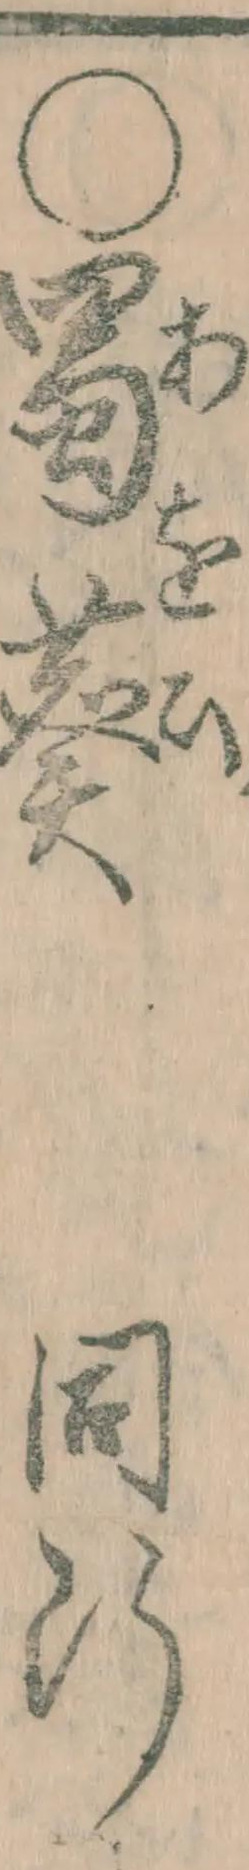〇蜀葵同断
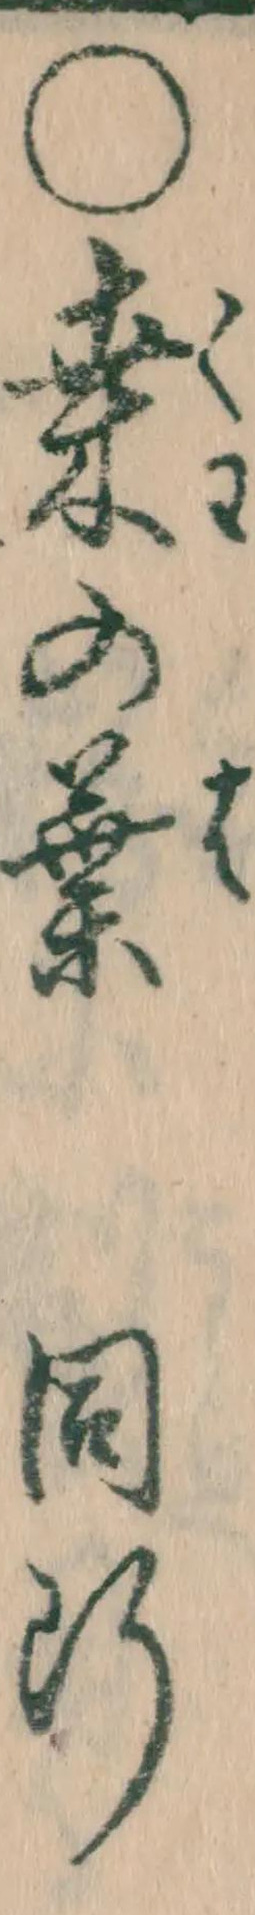〇桑の葉同断
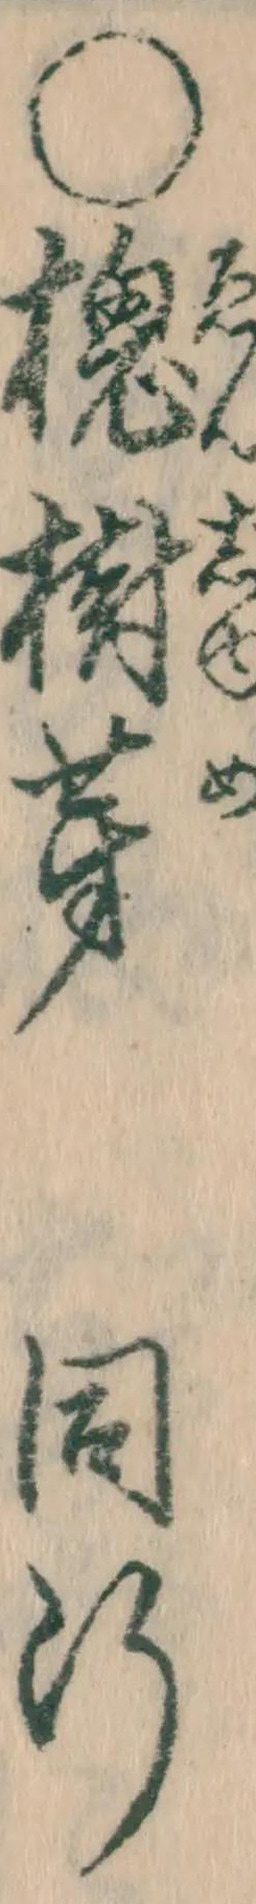〇槐樹芽同断
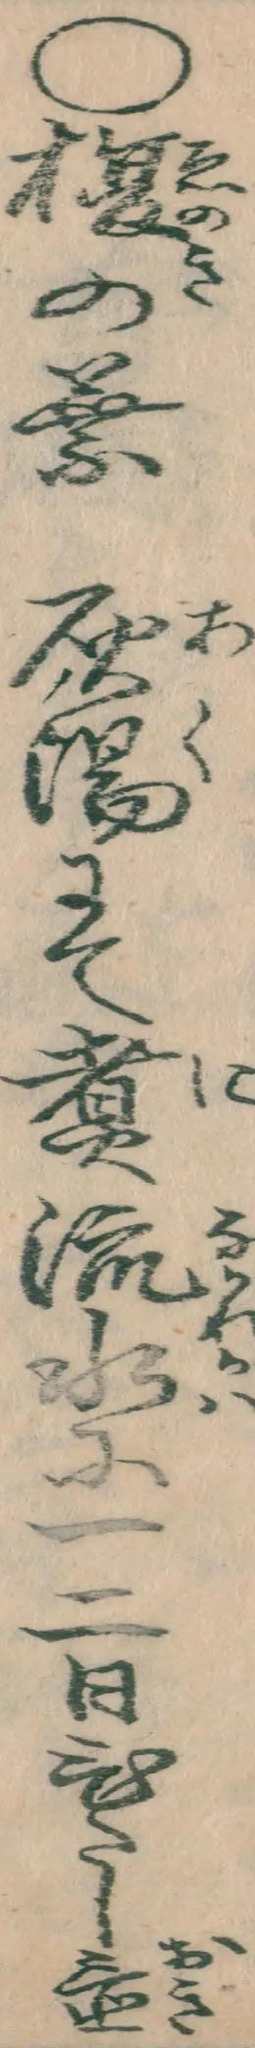〇榎の葉灰湯にて煮流水に一二日ひたし置
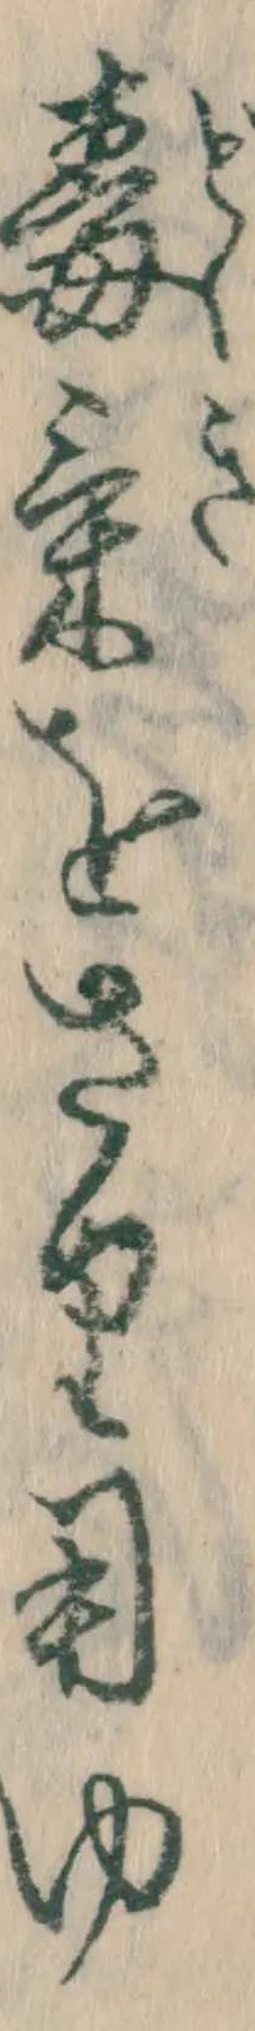毒気をさり用ゆ
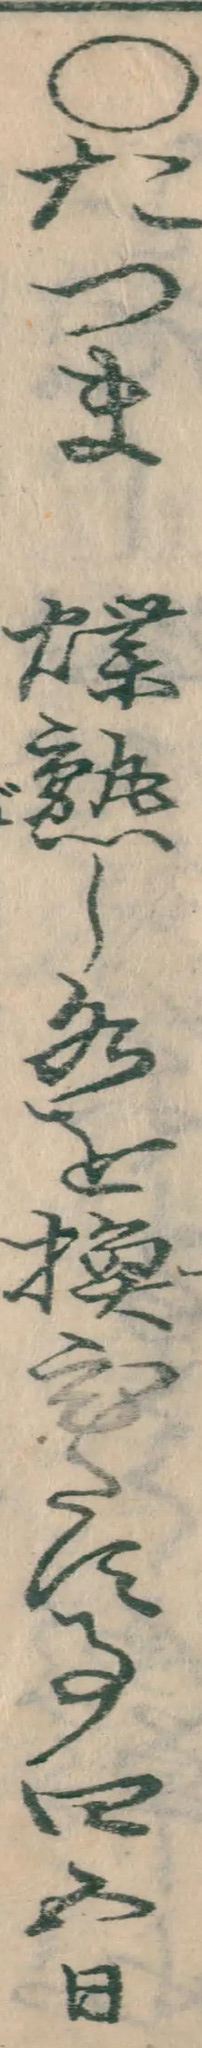〇だつま爛熟し水を換ひたす事四五日
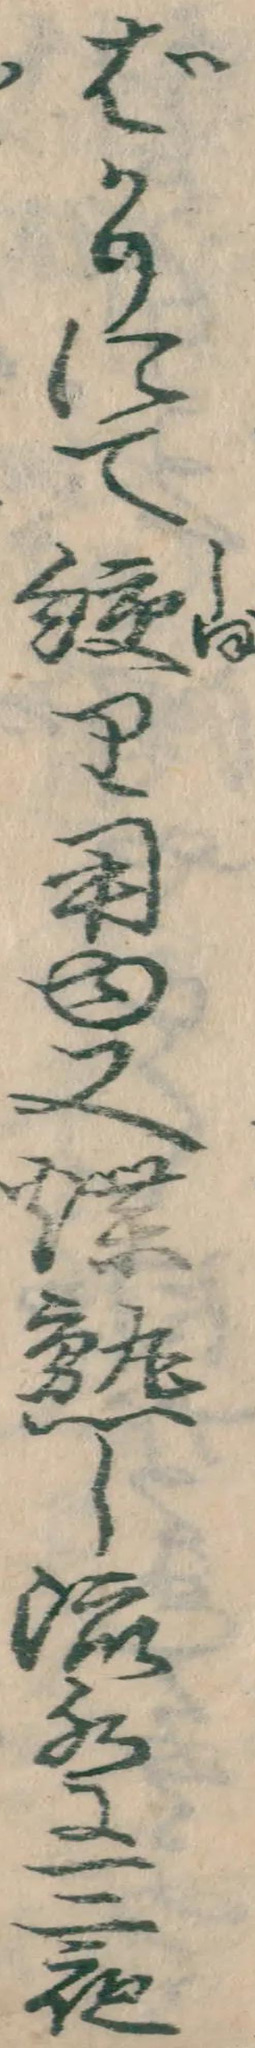ばかりにて絞り用ゆ又爛熟し流水に一二夜
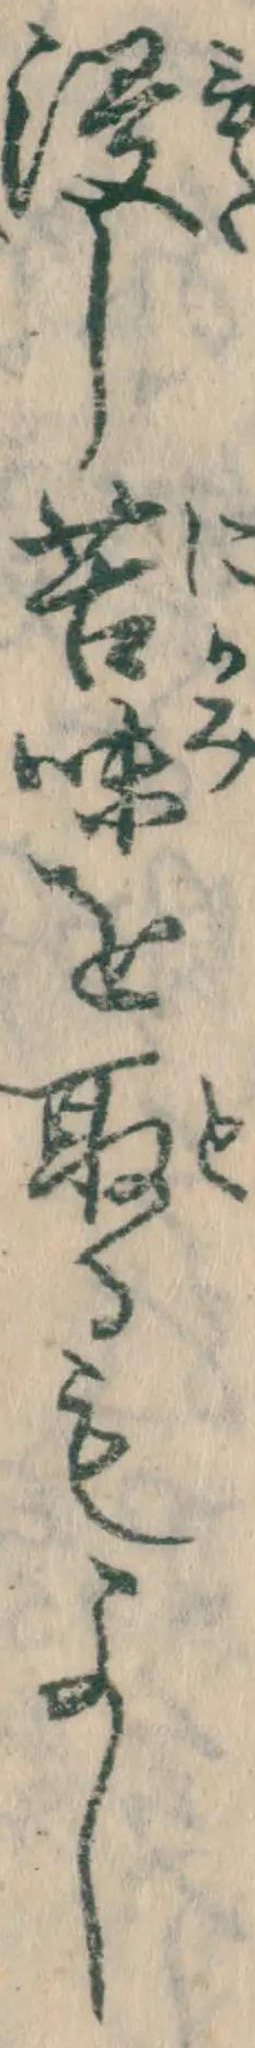浸し苦味を取るもよし
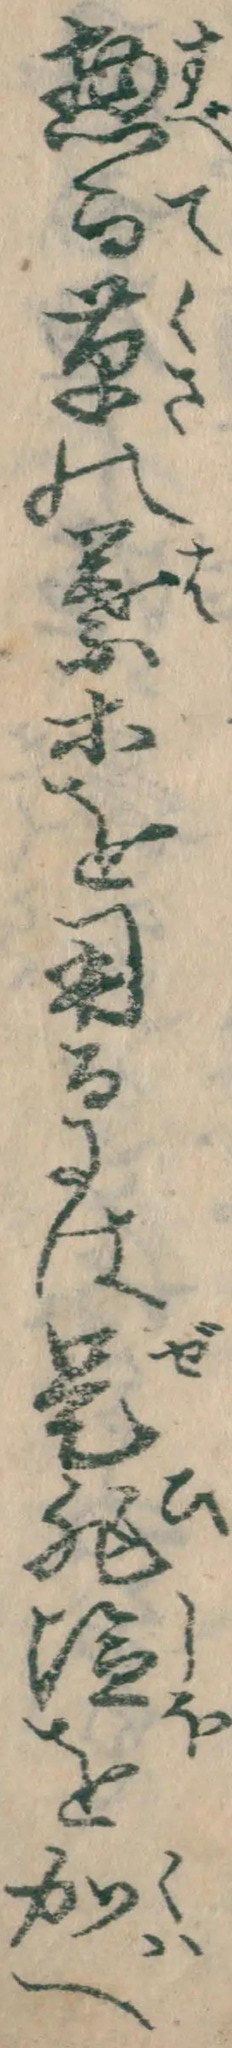惣而草の葉等を用る事は是非塩を加へ

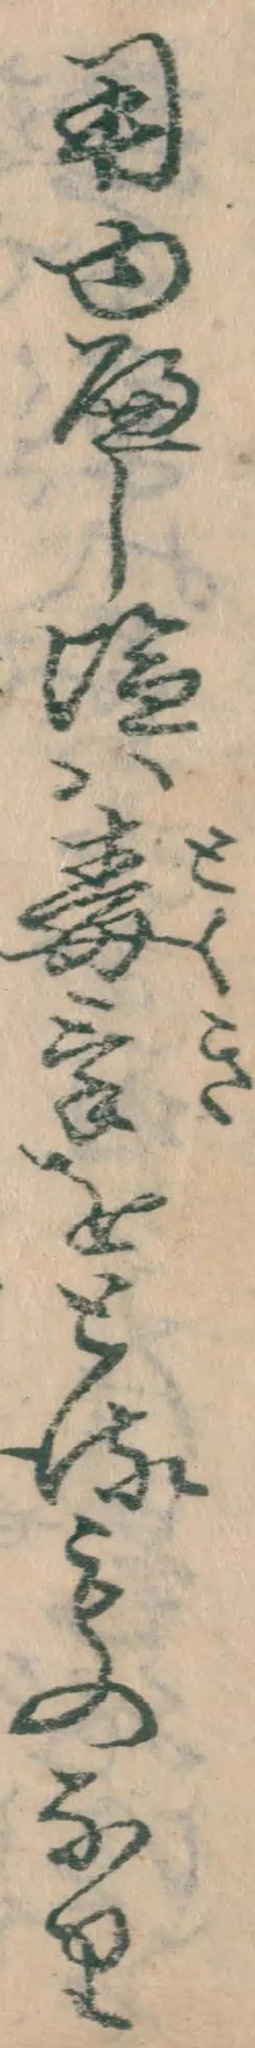用ゆべし塩は毒気をとるものなり
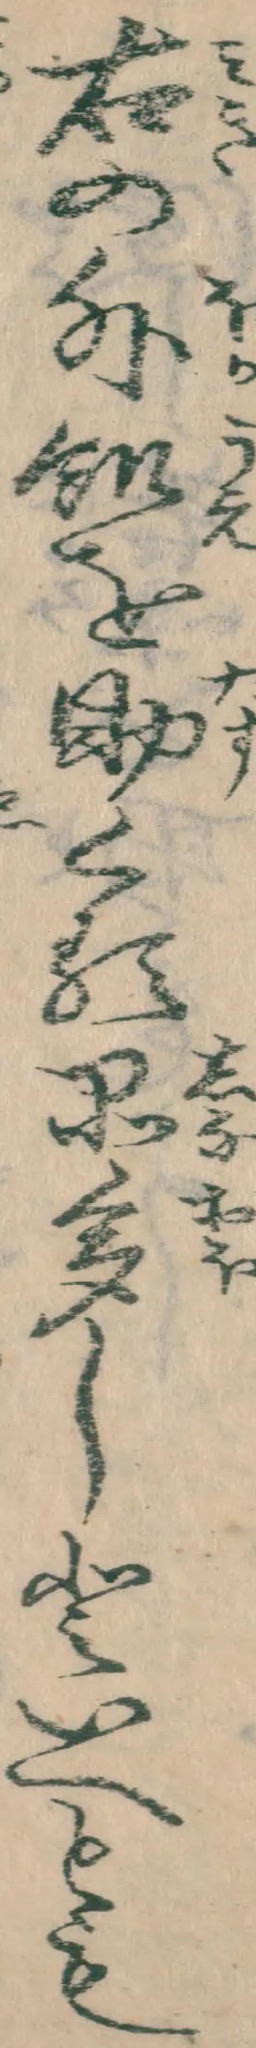右の外飢を助くる品多しといへとも
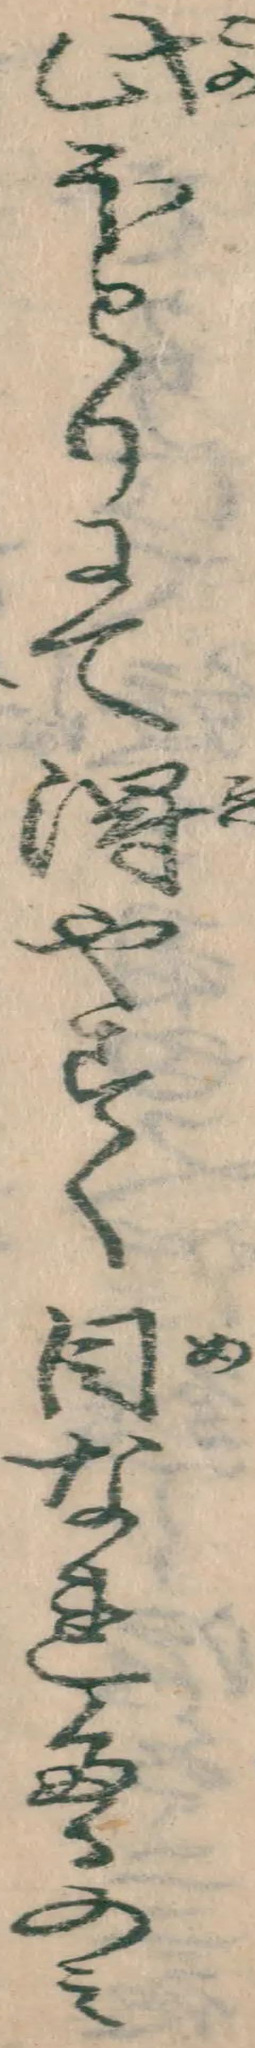このほとりにて得やすく目なれたるのみ
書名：救荒鄙諭
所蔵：国立国会図書館 National Diet Library, JAPAN
